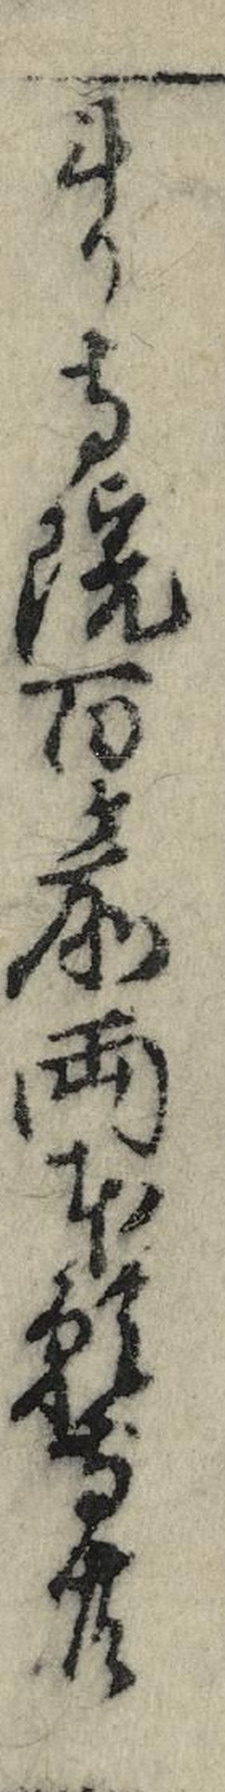計り寺院百ケ所両本願寺共
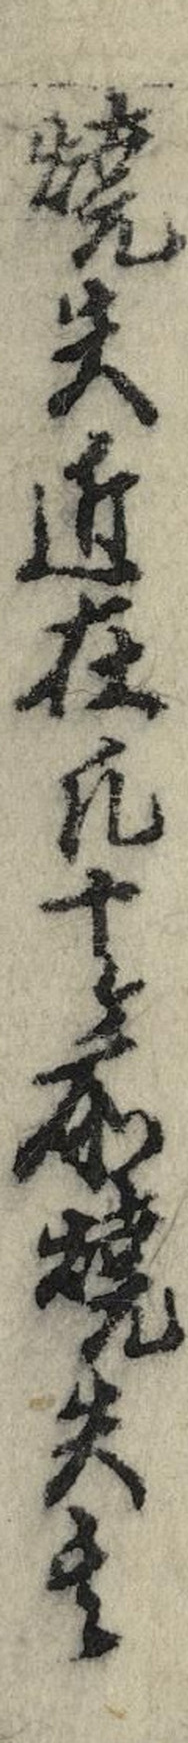焼失近在凡十ケ所焼失其
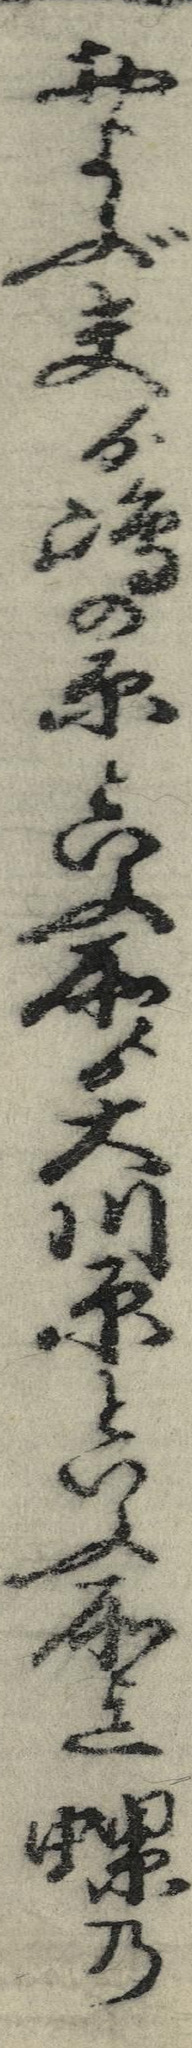及ぶ夫ゟ嶋の原といふ所ゟ大川原といふ所迄螺の
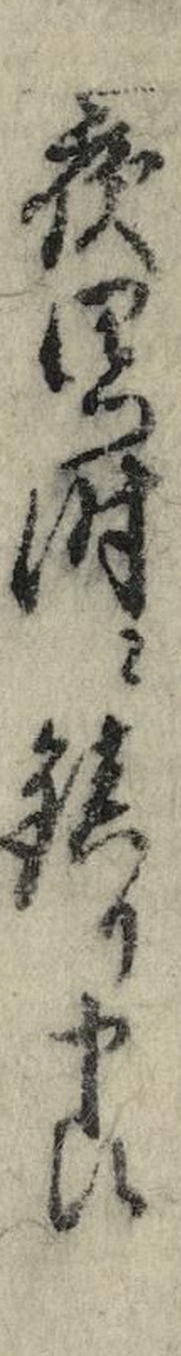夜四ツ時に静り申候
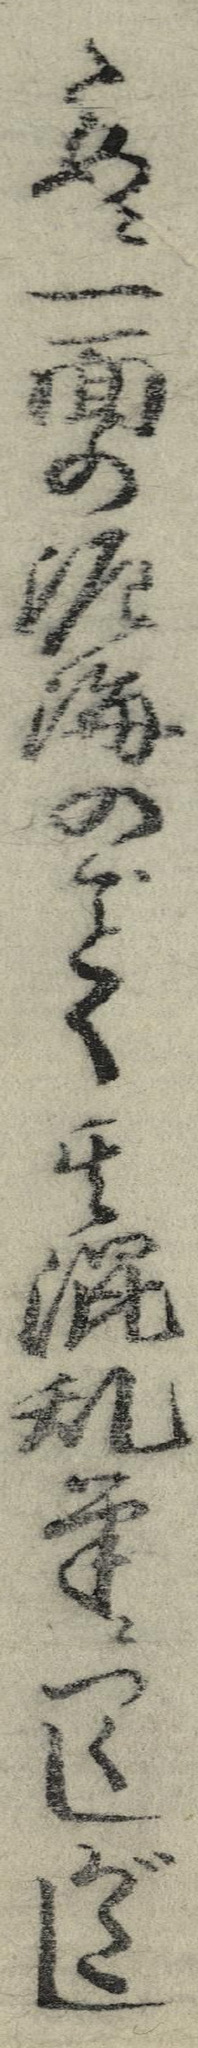ために一面の泥海のごとく其混乱筆につくしがたし
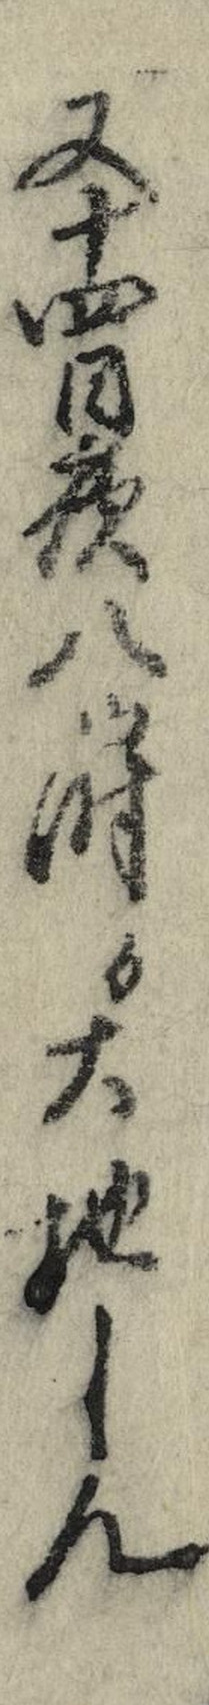又十四日夜八ツ時ゟ大地しん
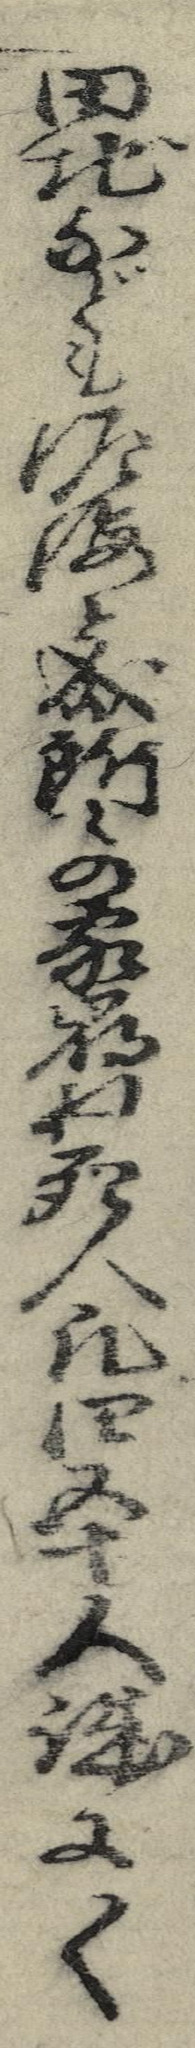田地ほども泥海と成所々の家崩内死人凡四五十人誠に〳〵
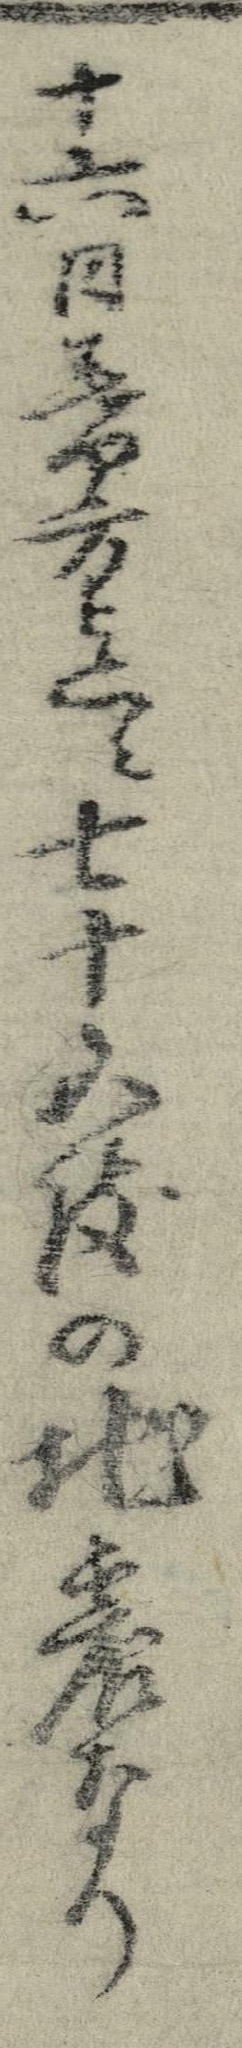十六日暮方迄に七十五度の地震なり
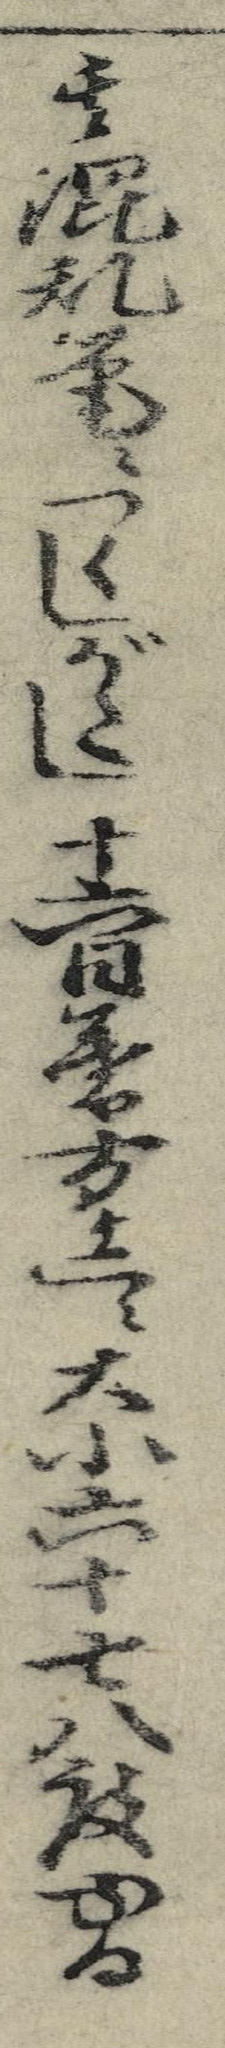其混乱筆につくしがたし十六日暮方迄に大小六十七八度ゆる
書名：聞書　諸國大地震并ニ出火
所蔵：東京大学地震研究所図書室 Earthquake Research Institute Library, The University of Tokyo, JAPAN
